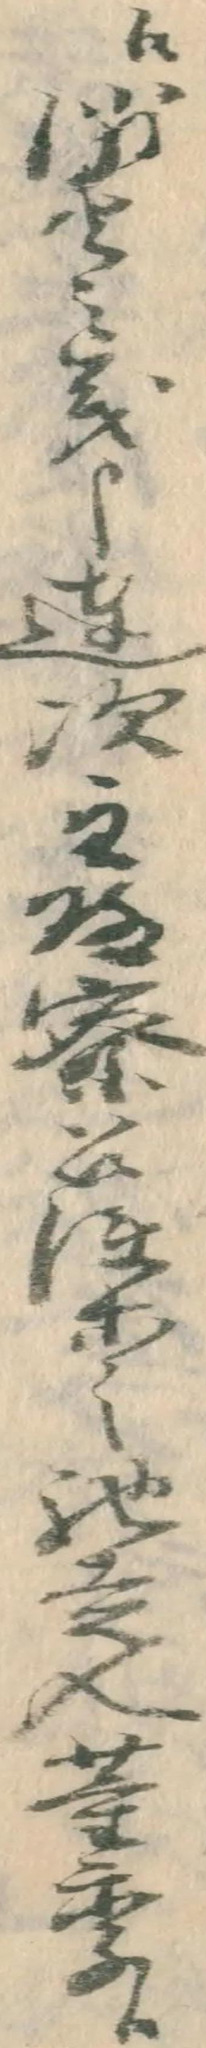え消火之義申達次主殿寮召使等之馳走入董季え
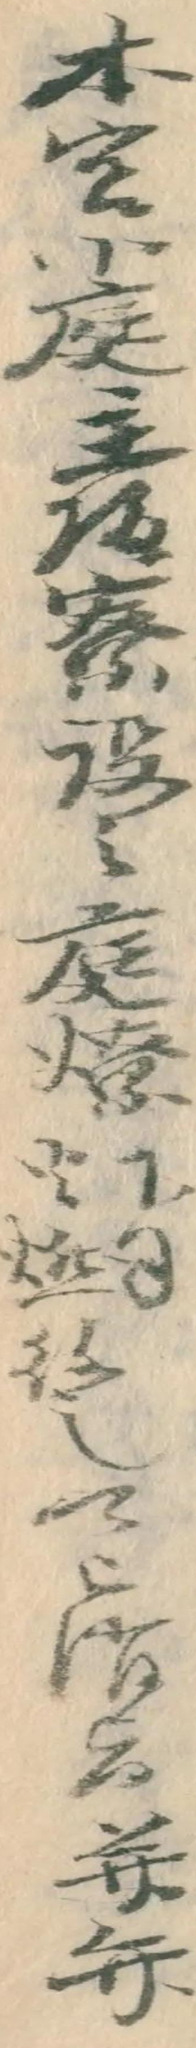本宮小庭主殿寮設之庭燎灯焼役之可被消旨并弁

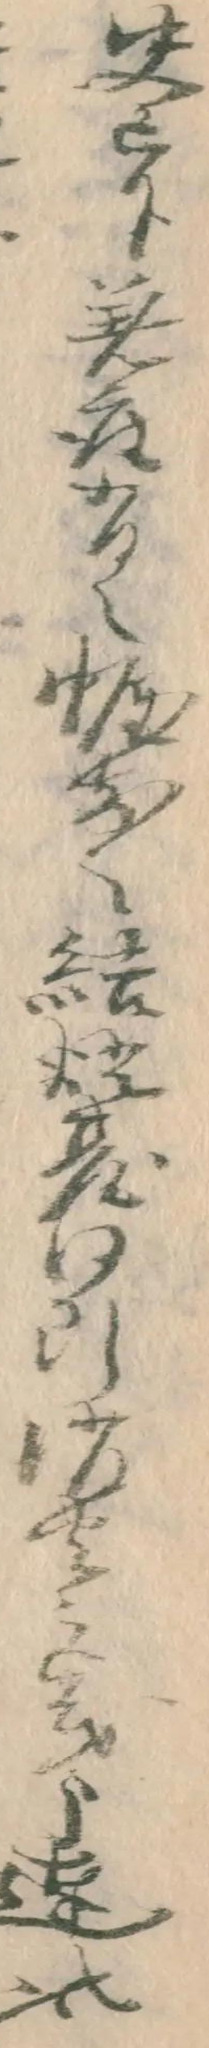史已下着座有之幄前之結燈臺同断消火之義申達此
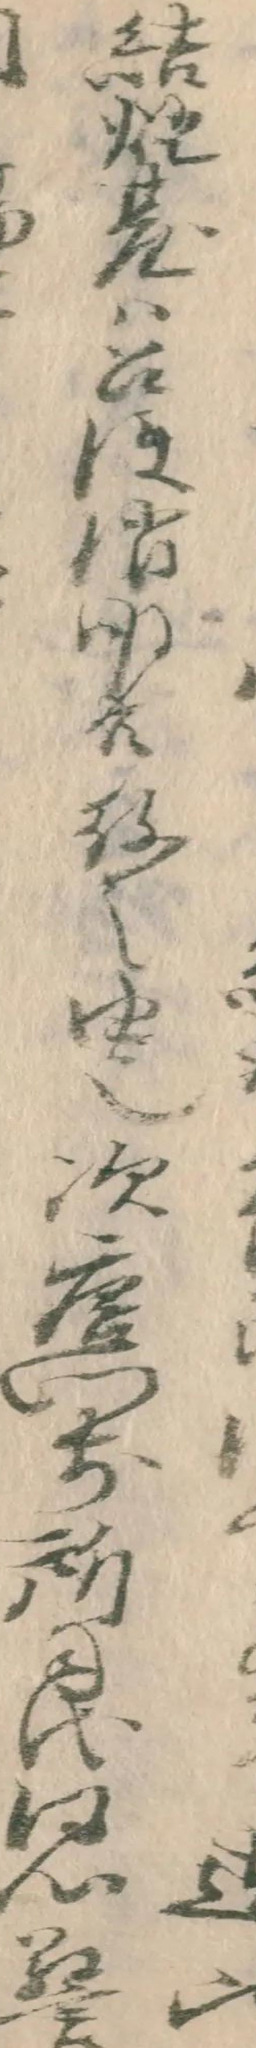結燈臺ハ召使消明共役之由也次唐門前所司代同心難合
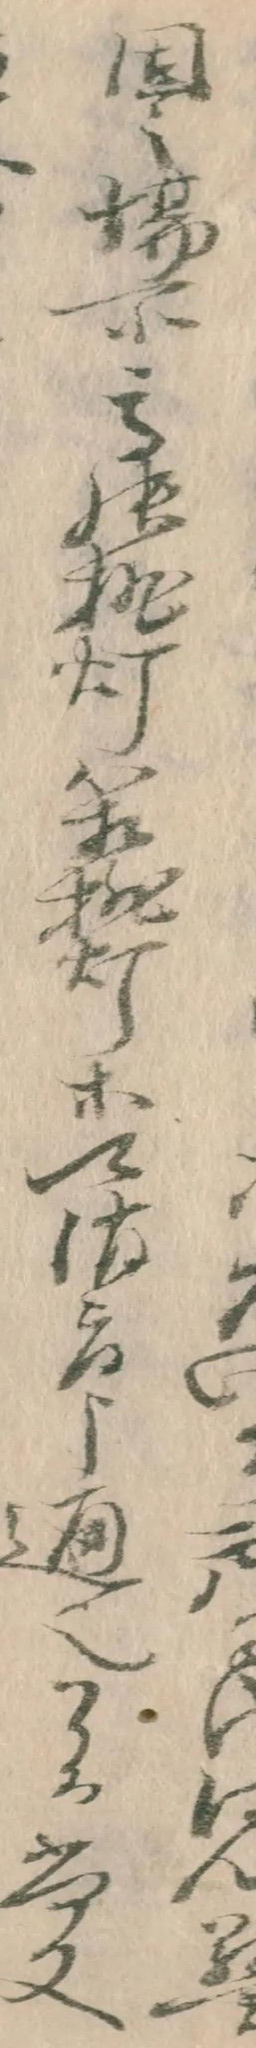固之場所高張挑灯箱提灯等可消旨申通也仍而尚又
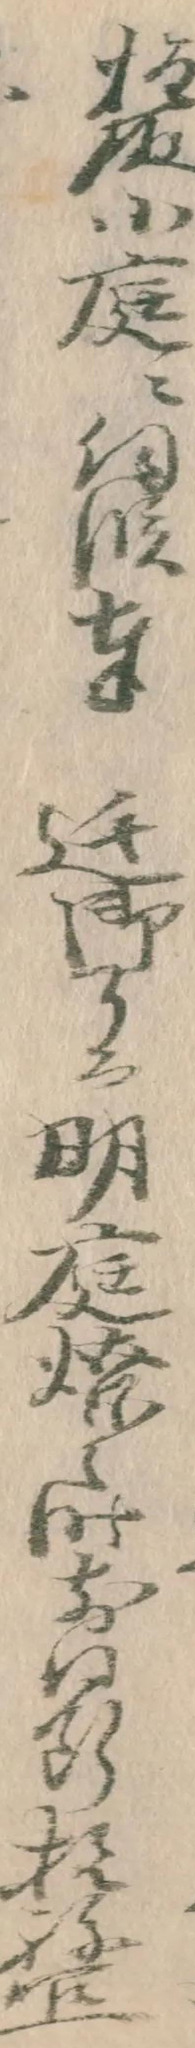縫殿小庭ニ伺候奉遷御了而明庭燎之時前同断権祢宜
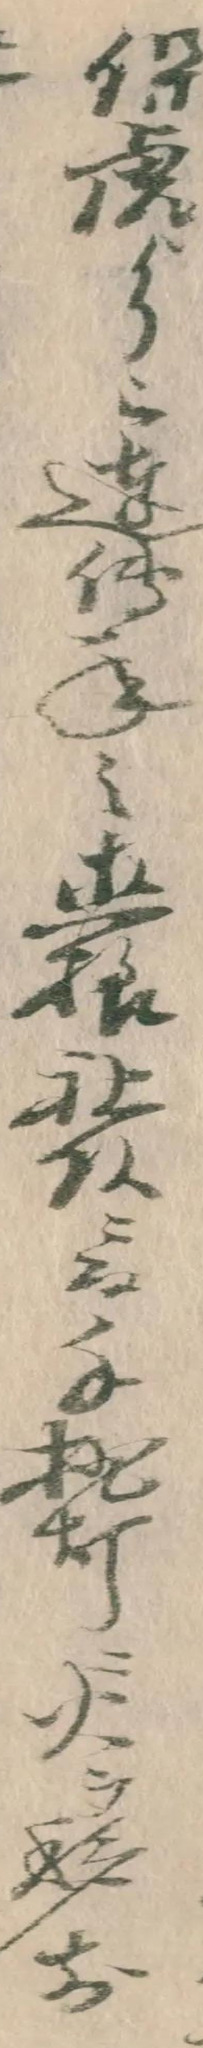保虎より被達傳承之直様社頭ニ而手挑灯ニ火ヲ移前
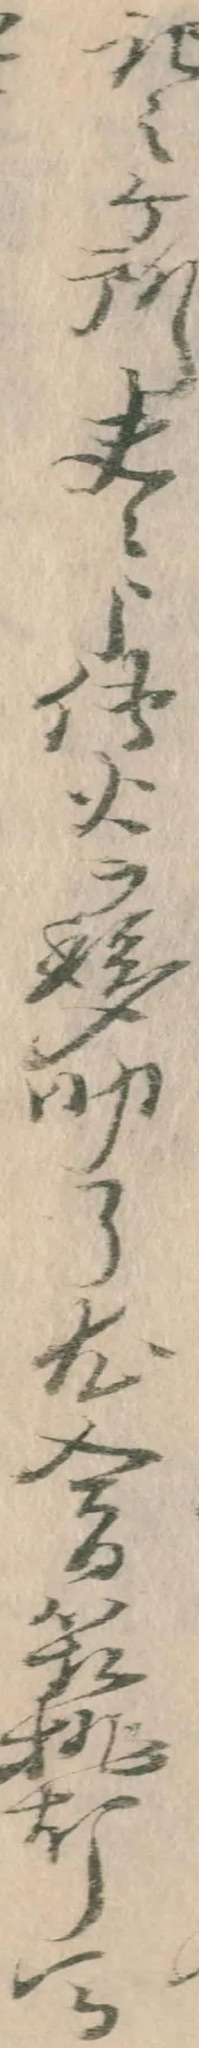記之ケ所夫〻申傳火ヲ移助了尤今日箱挑灯高
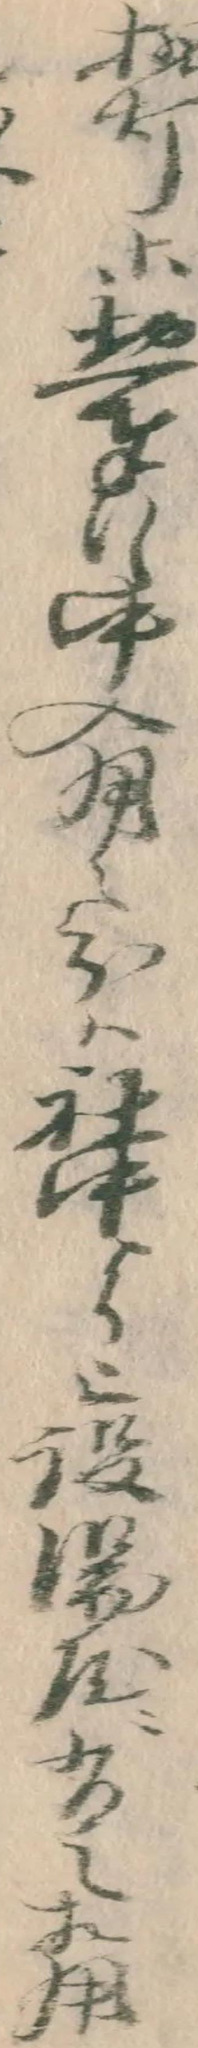挑灯等惣奉行中入用之分ハ社中より被設湯屋ニ有之相用
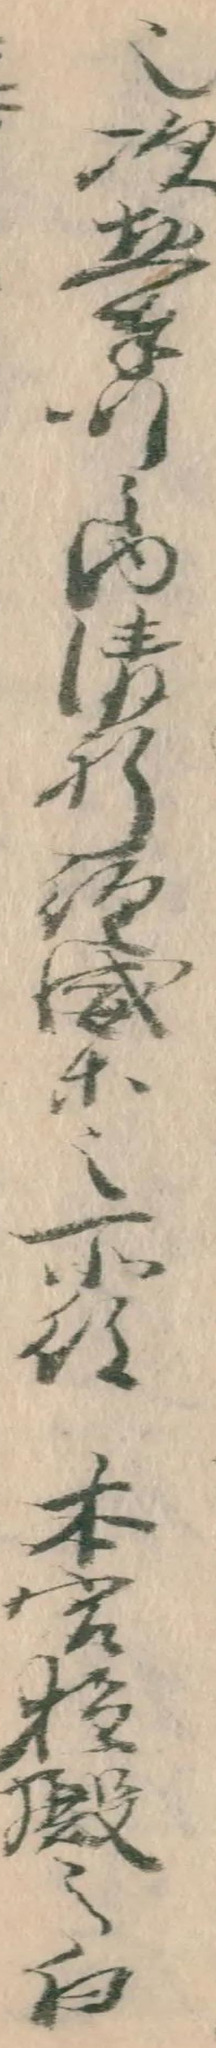也次惣奉行之内清祈経威等之所役本宮権殿之白
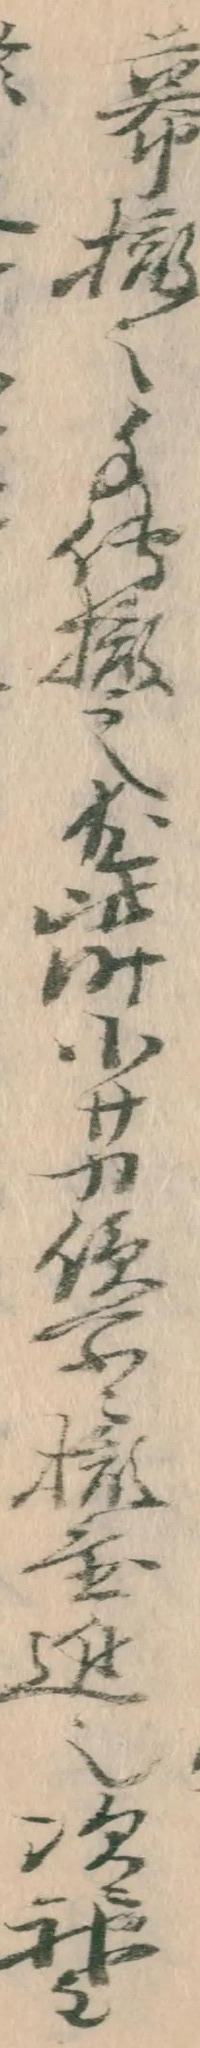幕撤之手傳撒之尤此時小サ刀便所ニ撤置進也次ニ神主
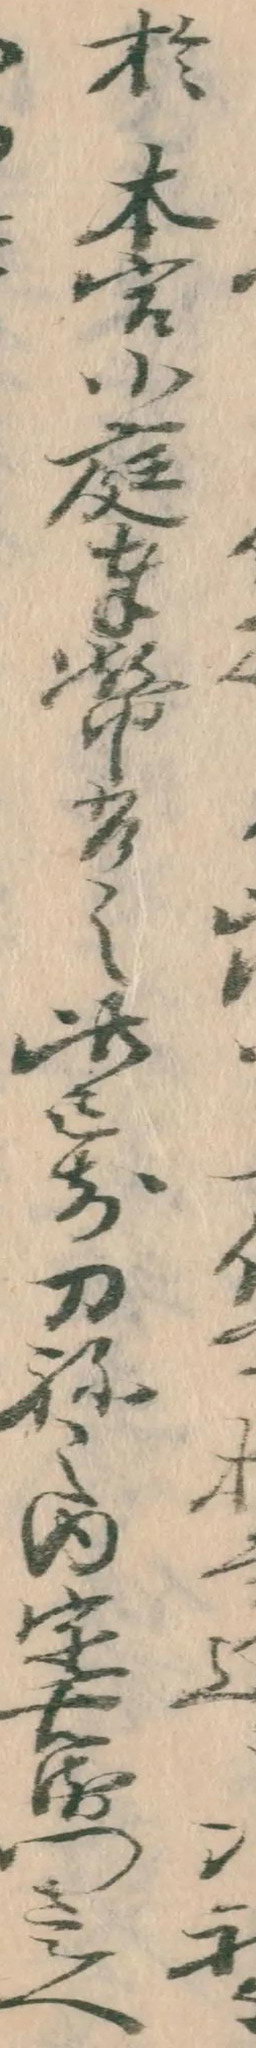於本宮小庭奉幣有之此已前刀祢之内定右衛門壱人
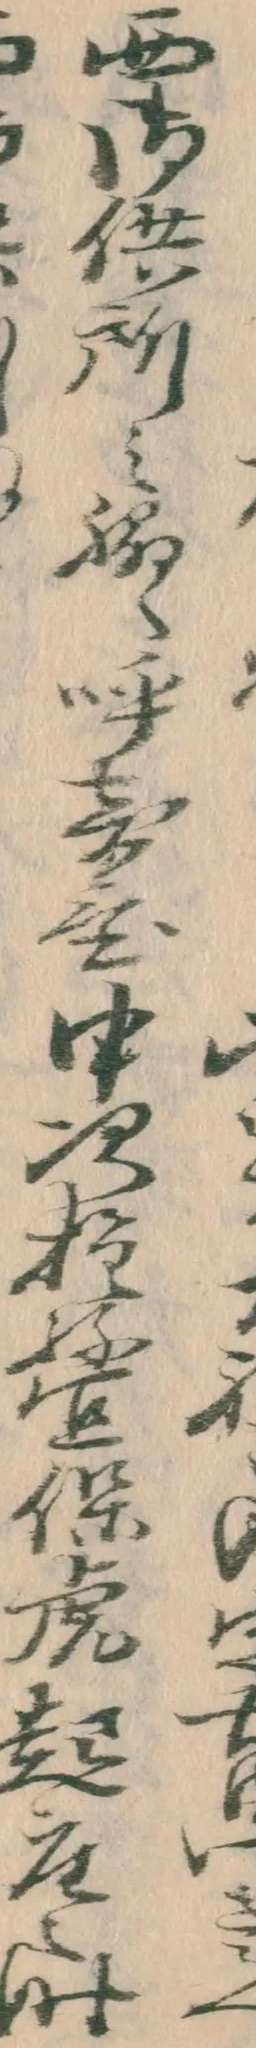西御供所之脇へ呼寄置中次権祢宜保虎起座之時
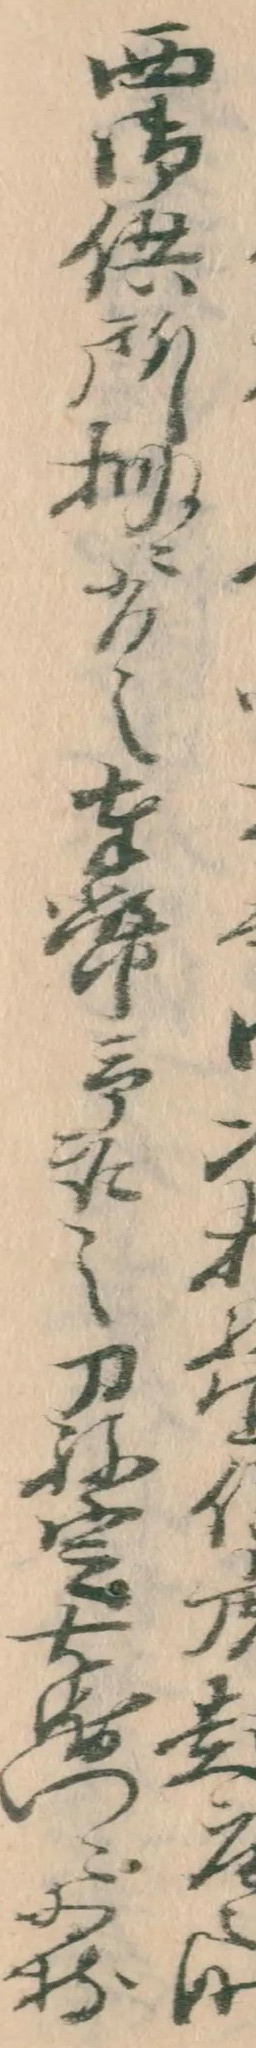西御供所棚ニ有之奉幣予取之刀祢定右衛門ニ為持
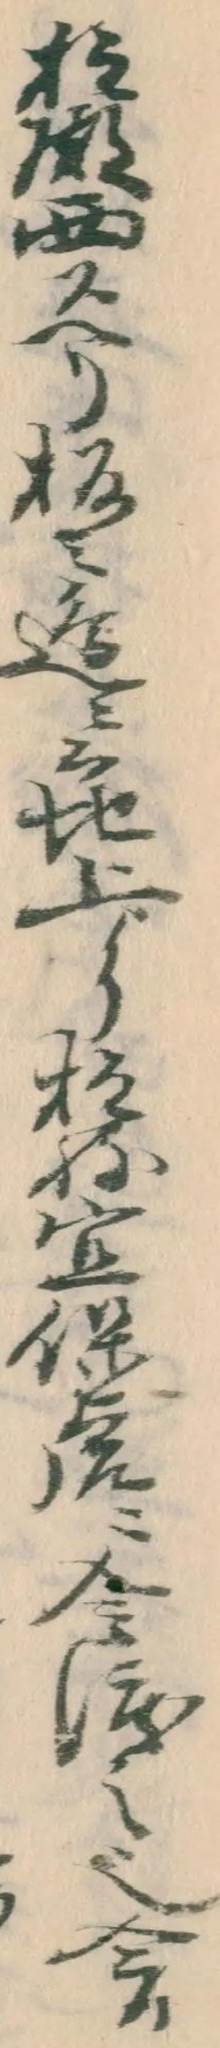権殿西スヘリ板之邊ニ而地上より権祢宜保虎ニ令渡之也今日
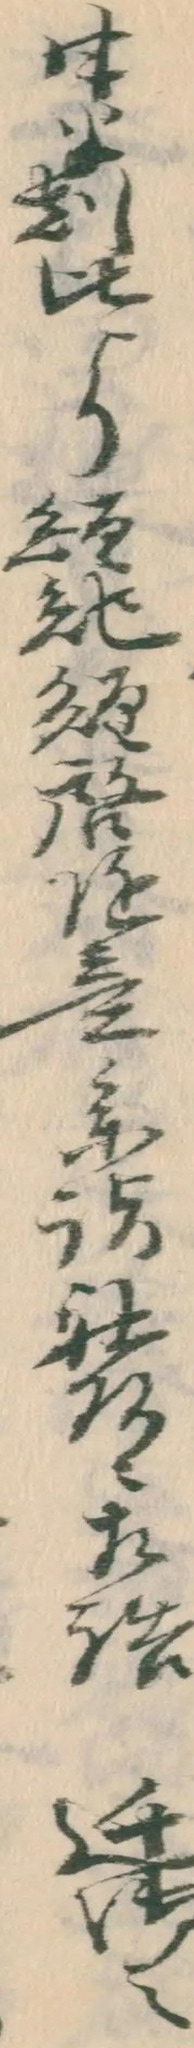中半刻比より経紀経啓随意参詣社頭ニ相詰遷御之
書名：賀茂社記録. 第67冊
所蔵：国立国会図書館 National Diet Library, JAPAN
